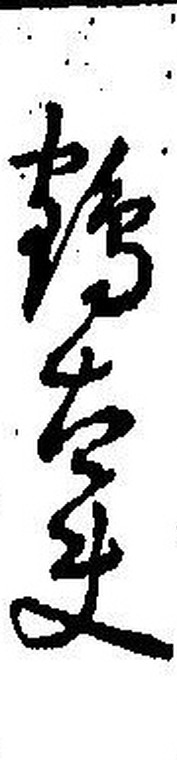鶴太夫
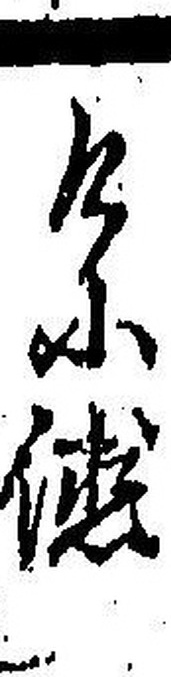けふ徳
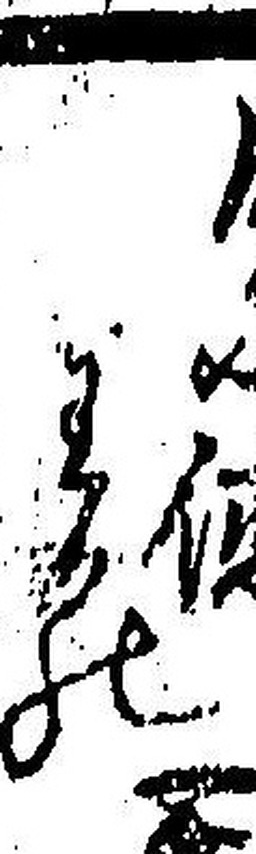わかの
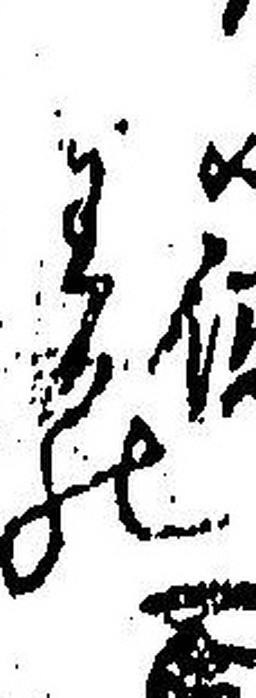わかの
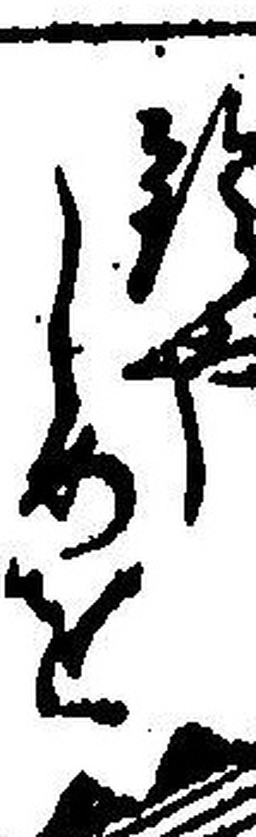しめを
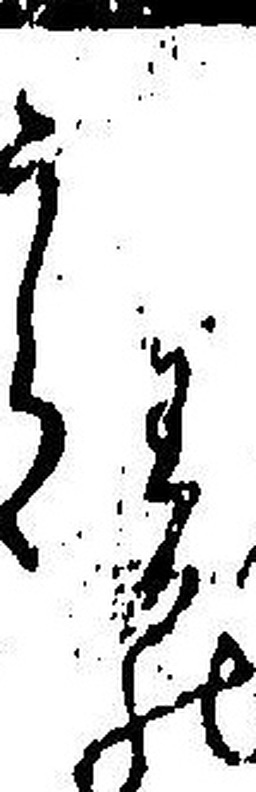うらゝ
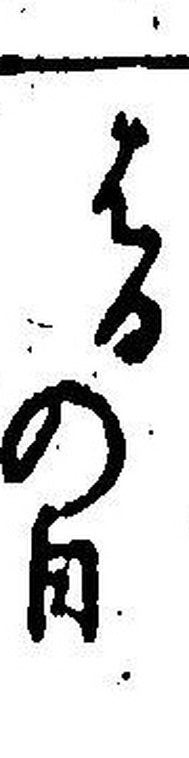はるの日
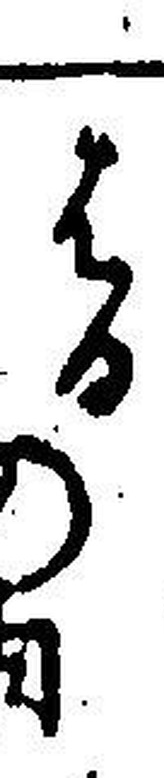はるの日
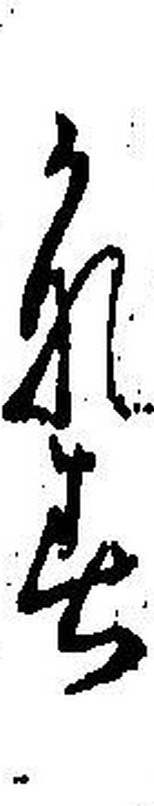かな春
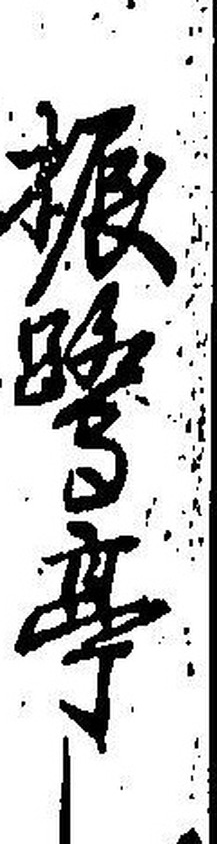振鷺亭
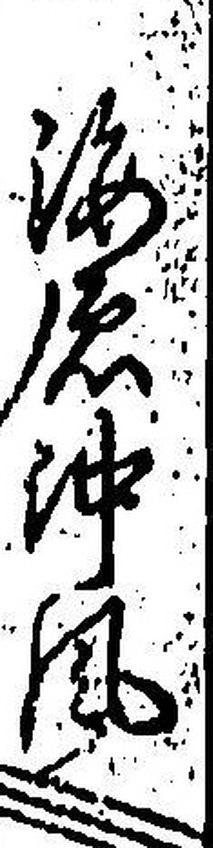海原沖風
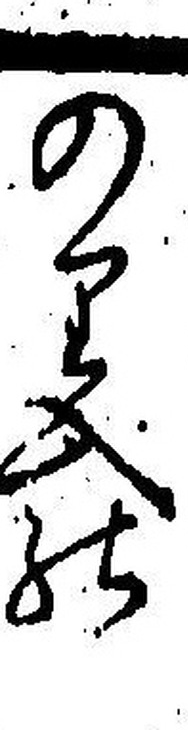のり入の
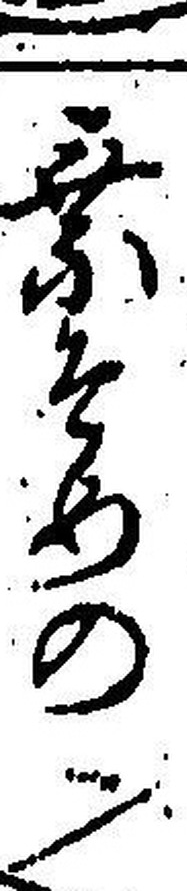乗そめの
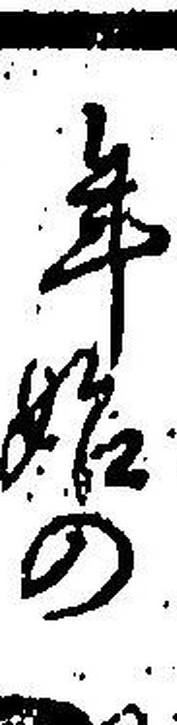年始の
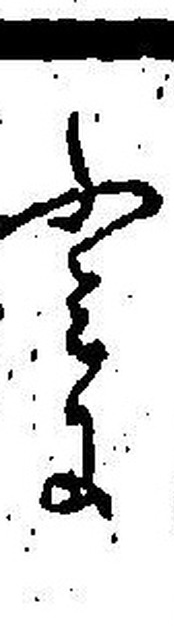ふみに
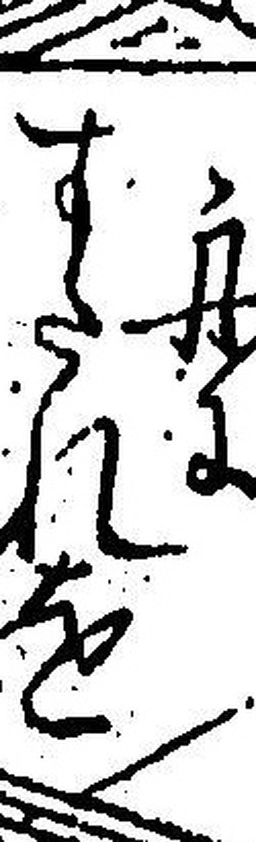すたれを
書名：どうれ百人一首 / 鹿都部真顔(狂歌堂)編
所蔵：東京大学総合図書館 General Library in the University of Tokyo, JAPAN
